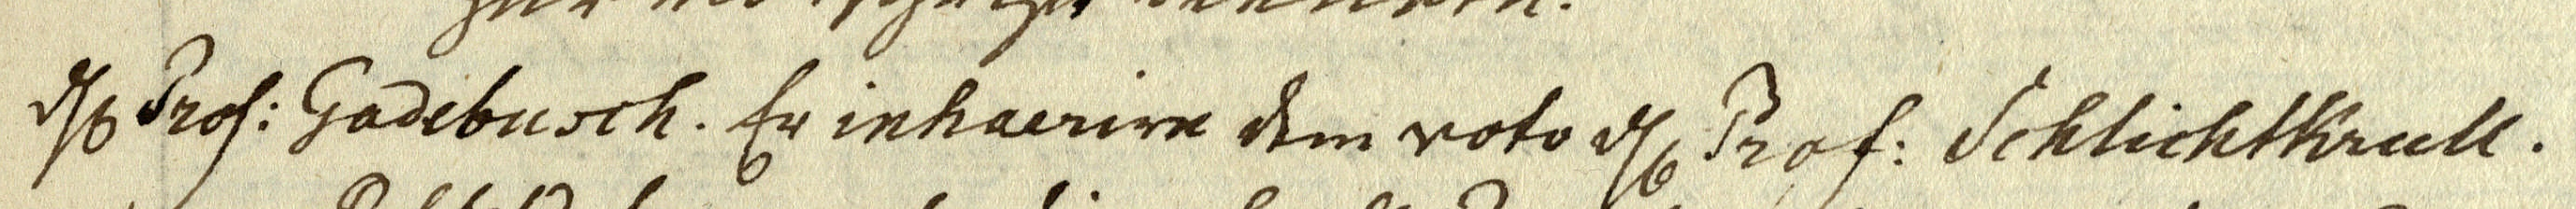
dh. Prof. Gadebusch. Er inhaerire dem voto dh Prof. Schlichtkrull.
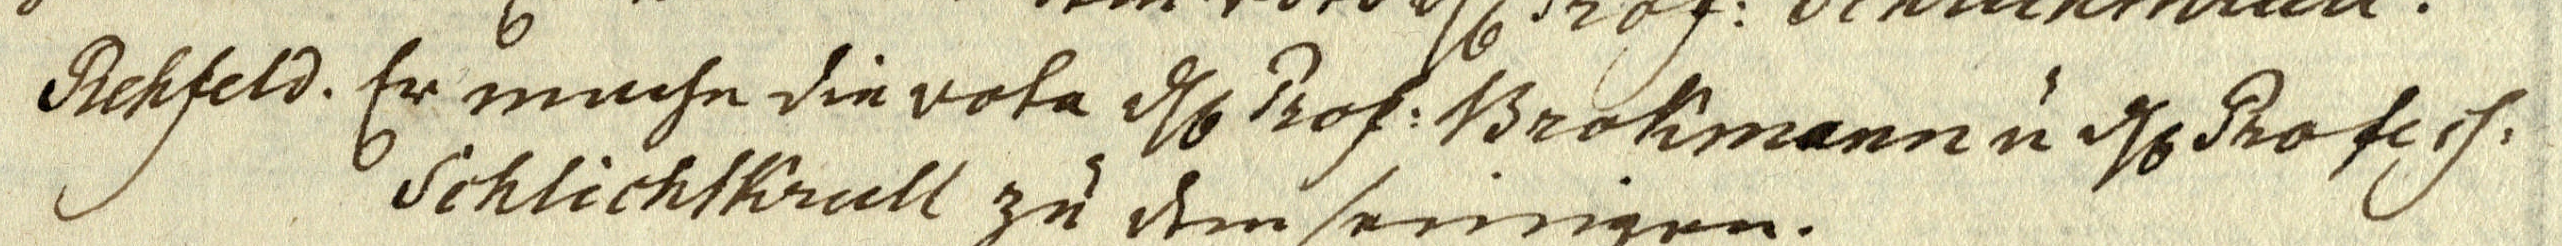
Rehfeld. Er mache die vota dh. Prof. Brokmannn u dh Profess.
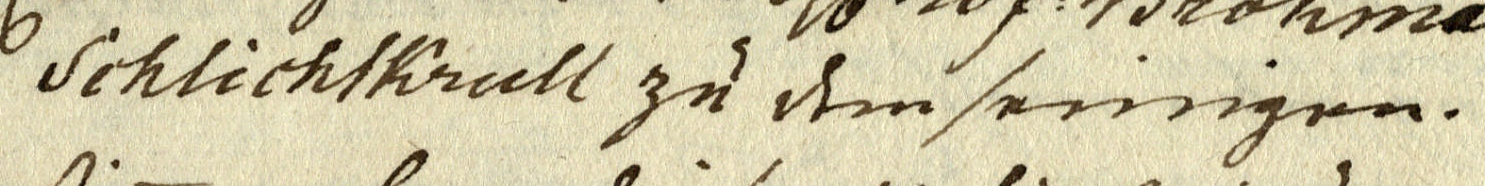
Schlichtkrull zu dem seinigen.
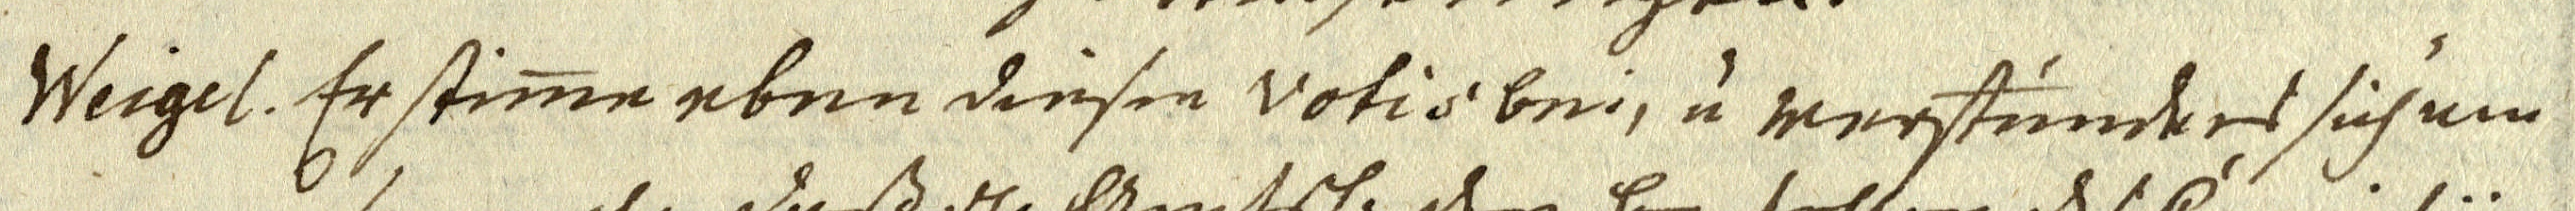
Weigel. Er stime eben diesen votis bei, zu verstünde es sich um
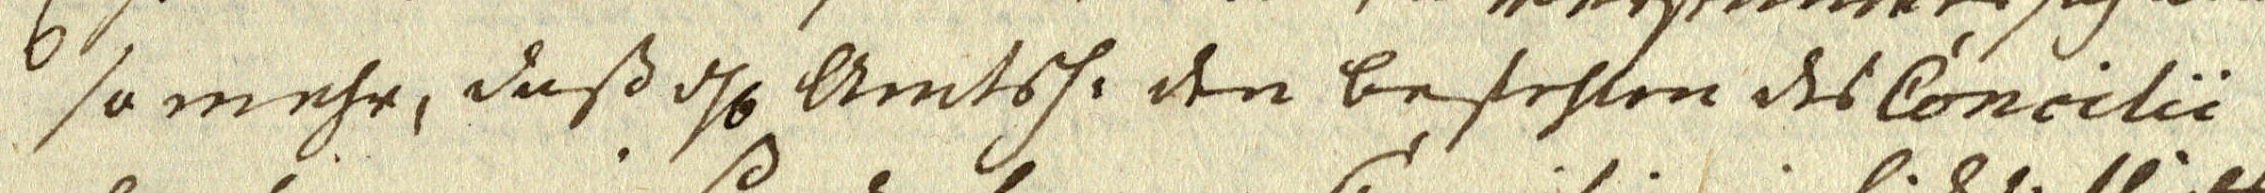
so mehr, daß dh Amtsh. den Befehlen des Concilii
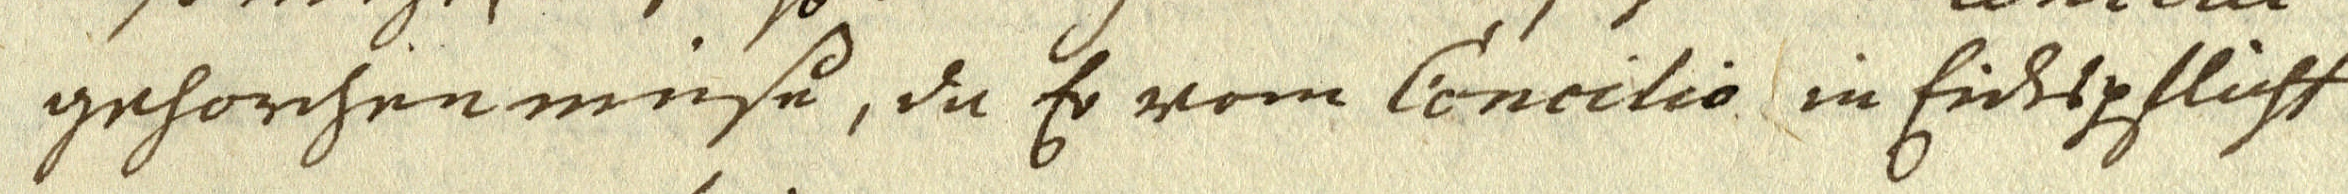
gehorchen müße, da Er vom Concilio in Eidespflicht
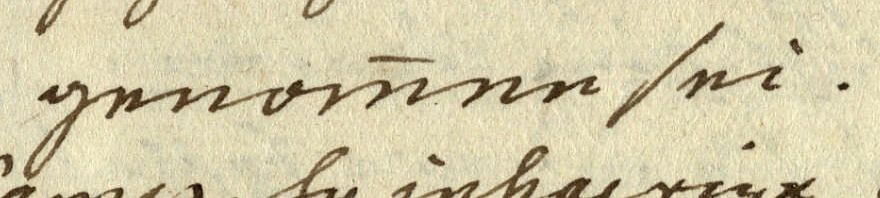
genomen sei.
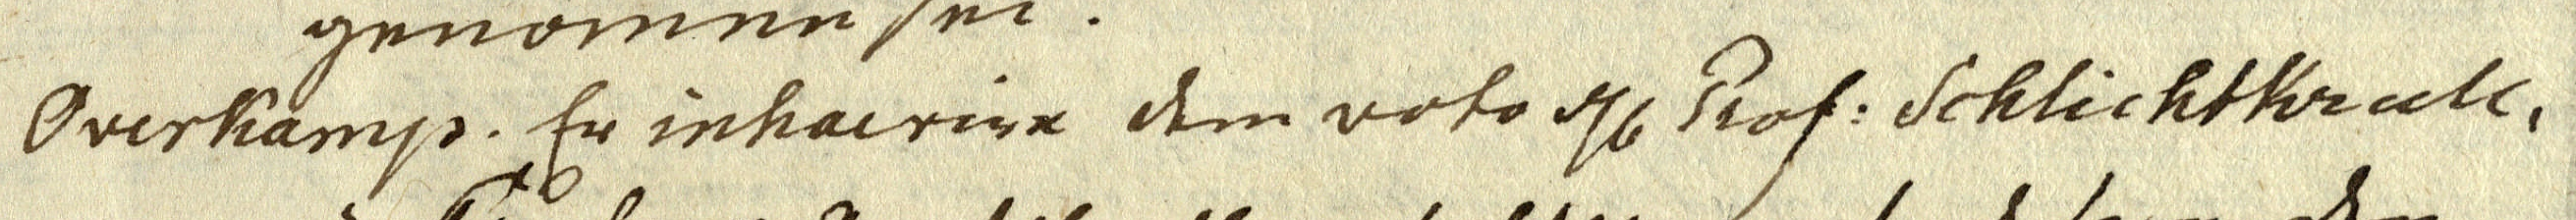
Overkamp. Er inhaerire dem voto dh Prof. Schlichtkrull,
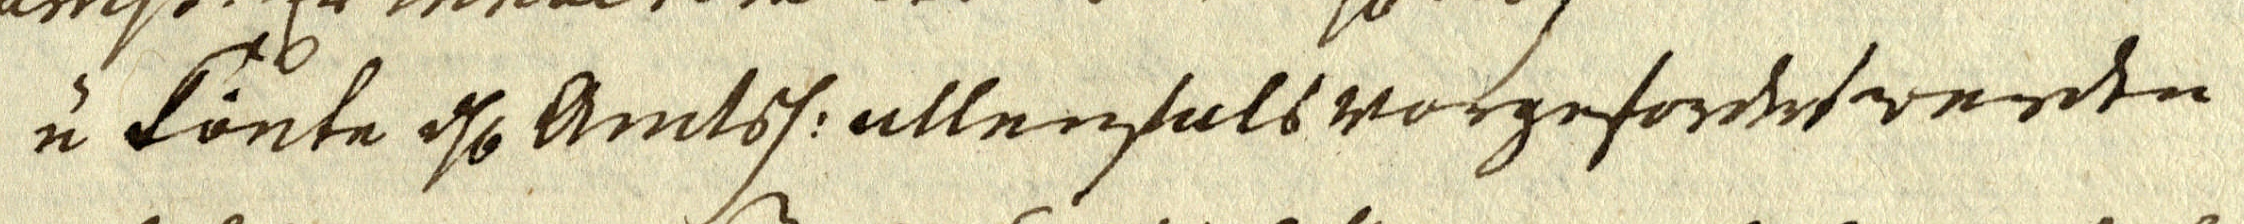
u könte dh Amtsh. allenfals vorgefordert werden.
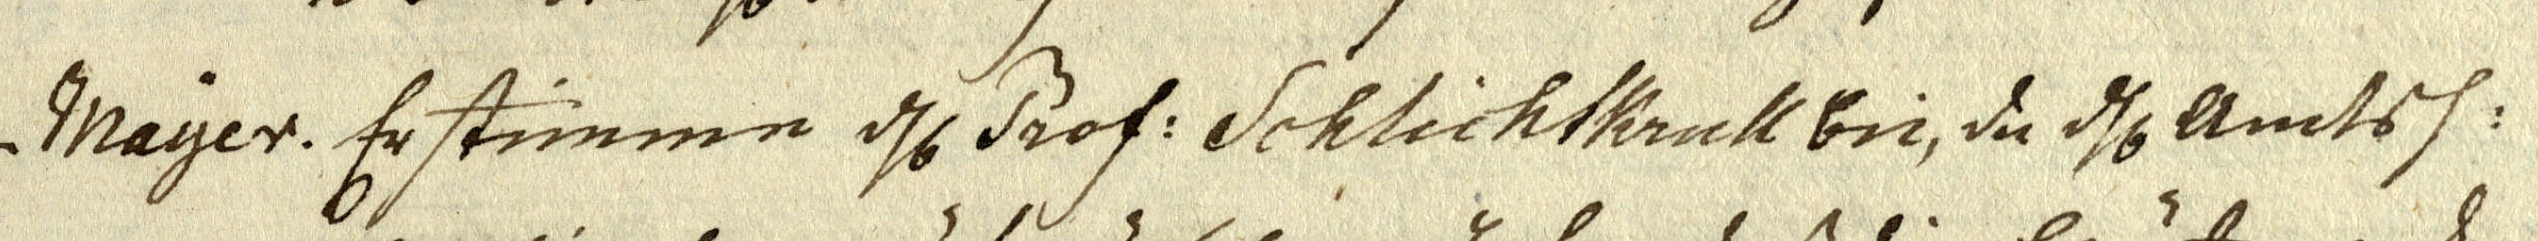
Maÿer. Er stimme dh. Prof. Schlichtkrull bei, da dh Amtsh.
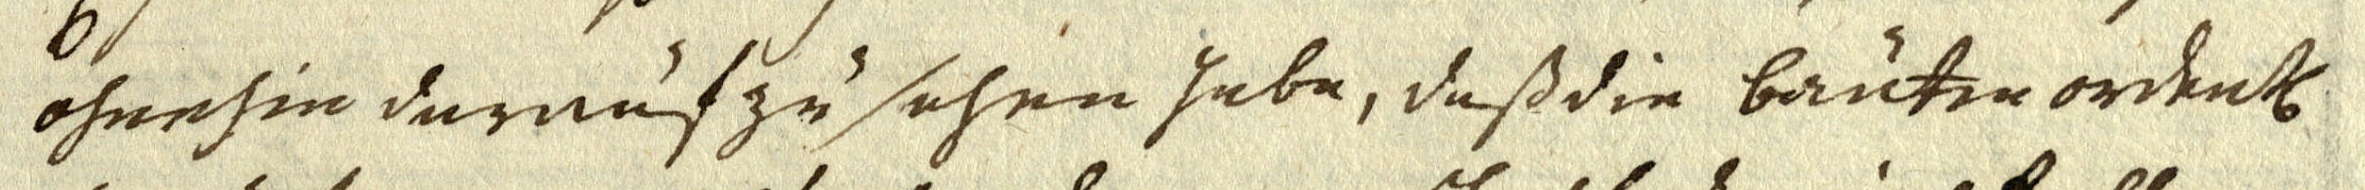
ohnehin darauf zu sehen habe, daß die Bauten ordentl.
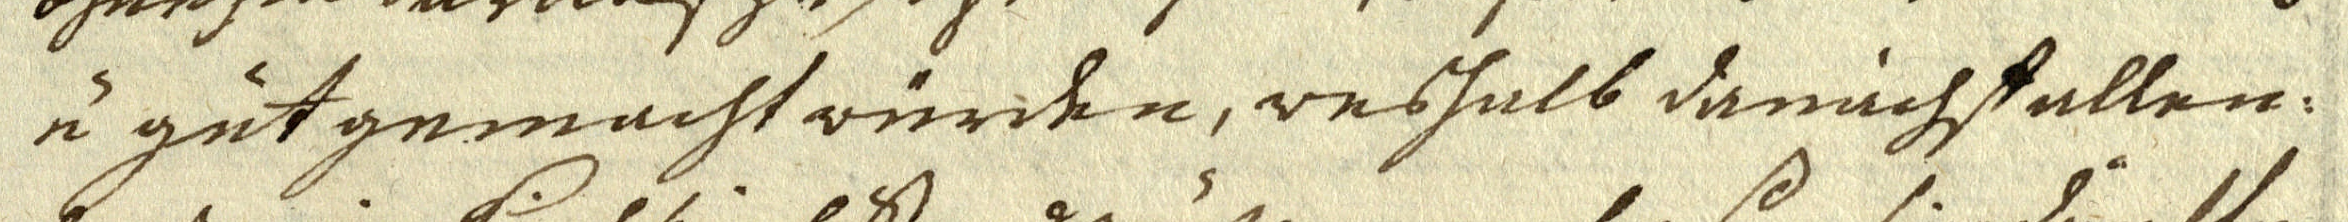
u gut gemacht würden, weshalb danächst allen¬
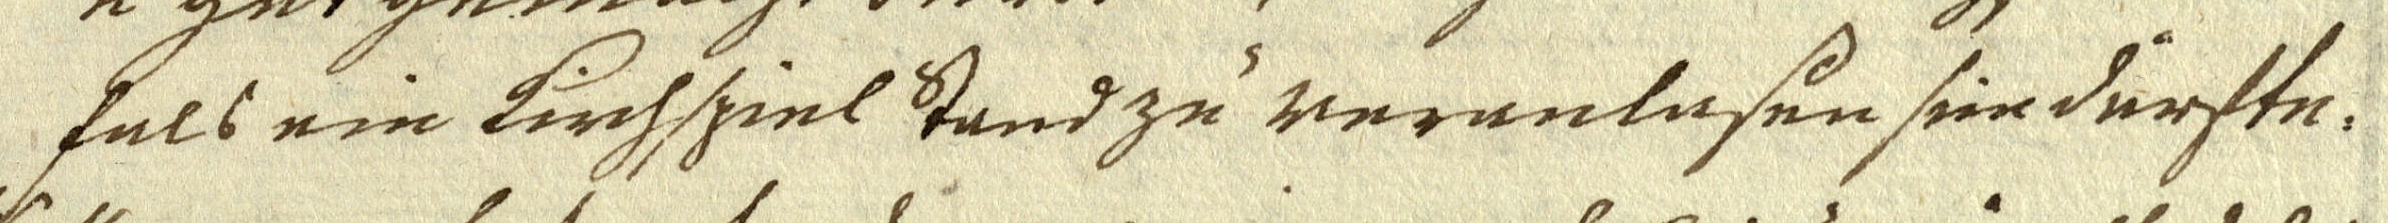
fals ein Kirchspiel Stand zu veranlaßen sein dürfte.
